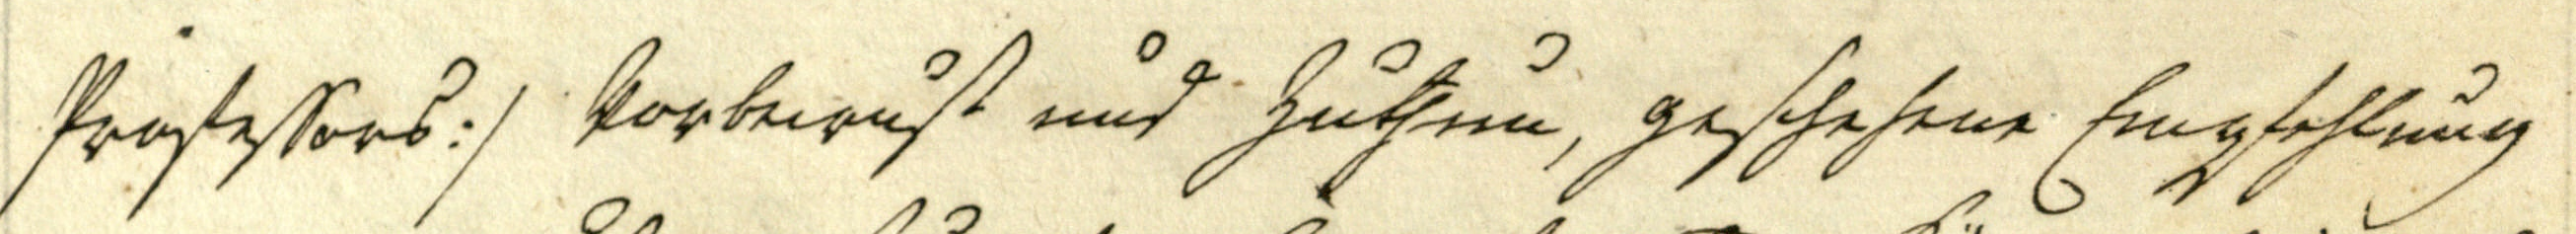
Professors / Vorbewust und Zuthun, geschehene Empfehlung
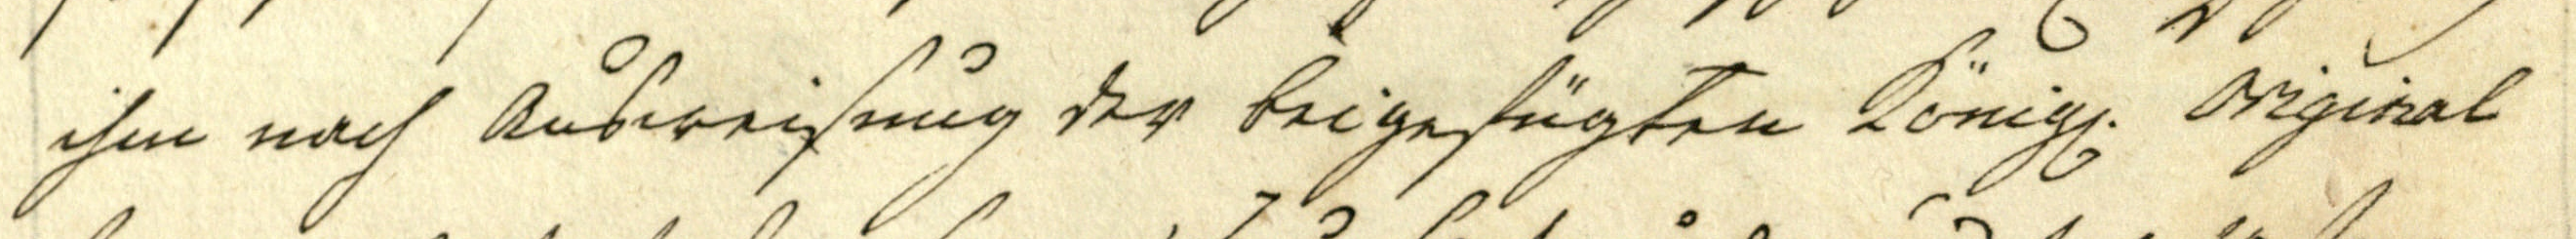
ihm nach Ausweisung der beigefügten Königl. Original
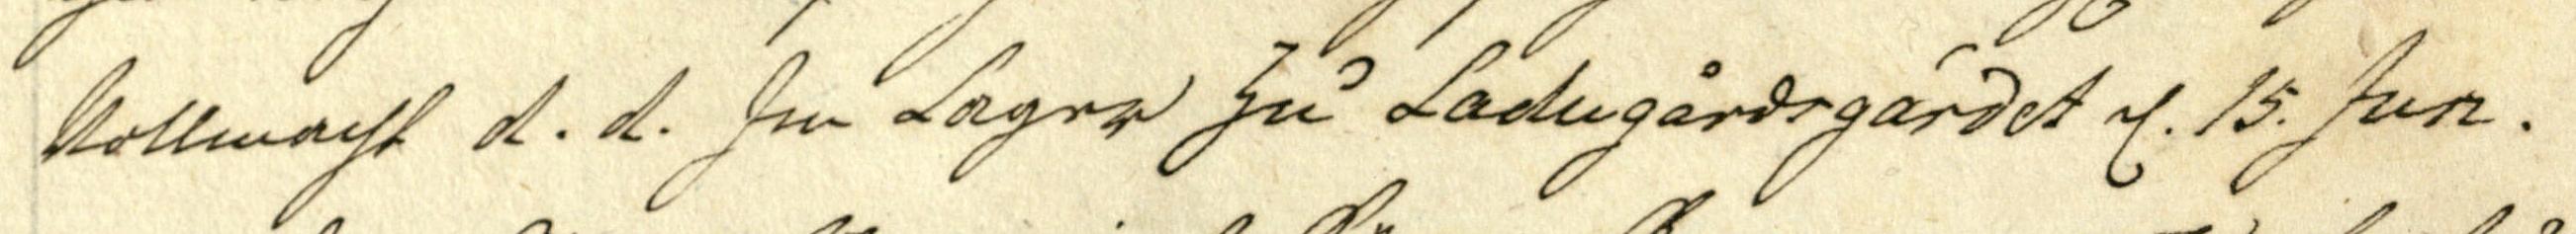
Vollmacht d. d. im Lager zu Ladugårdsgardet v. 15. Jun.
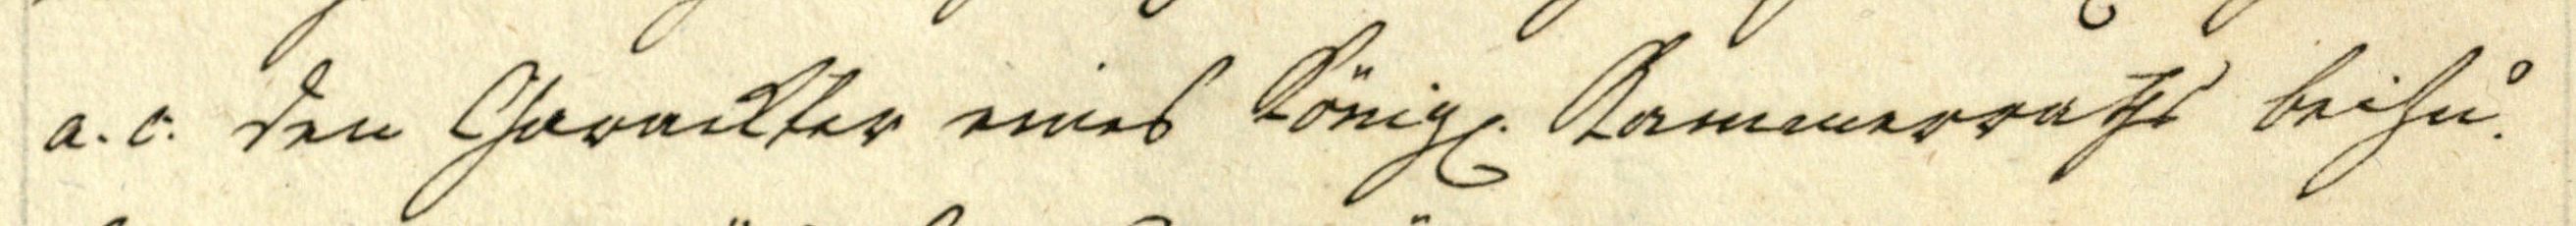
a. c. den Charackter eines Königl. Kammerraths beizu¬
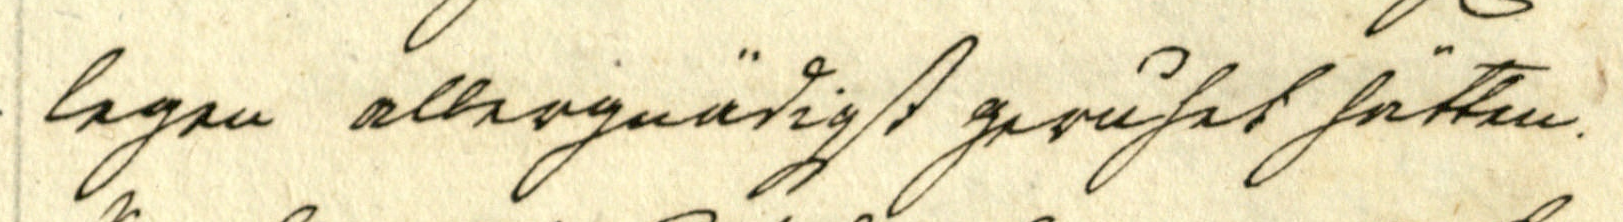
legen allergnädigst geruhet hätten.
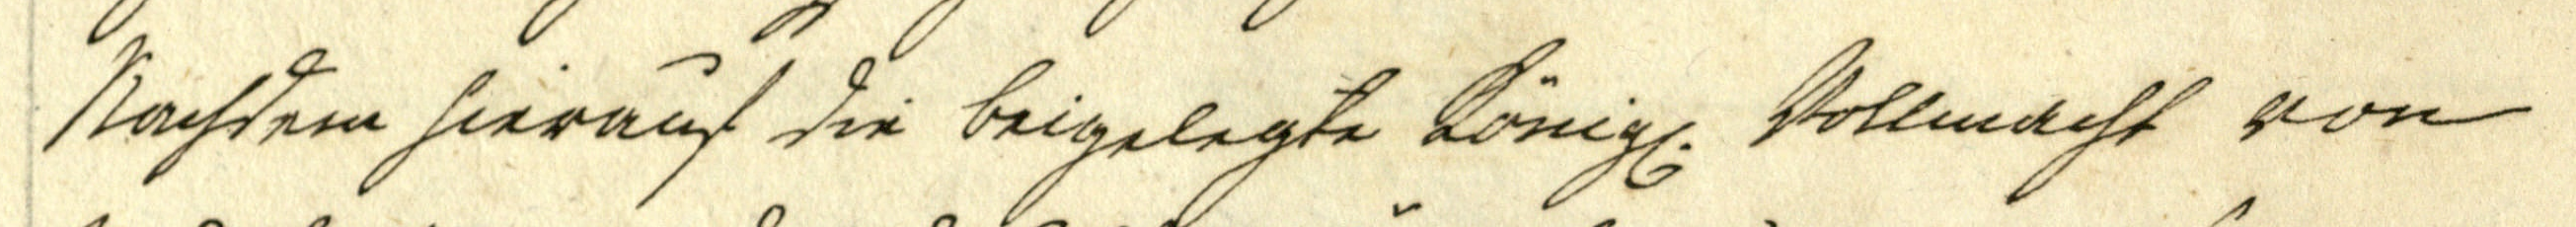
Nachdem hierauf die beigelegte Königl. Vollmacht von
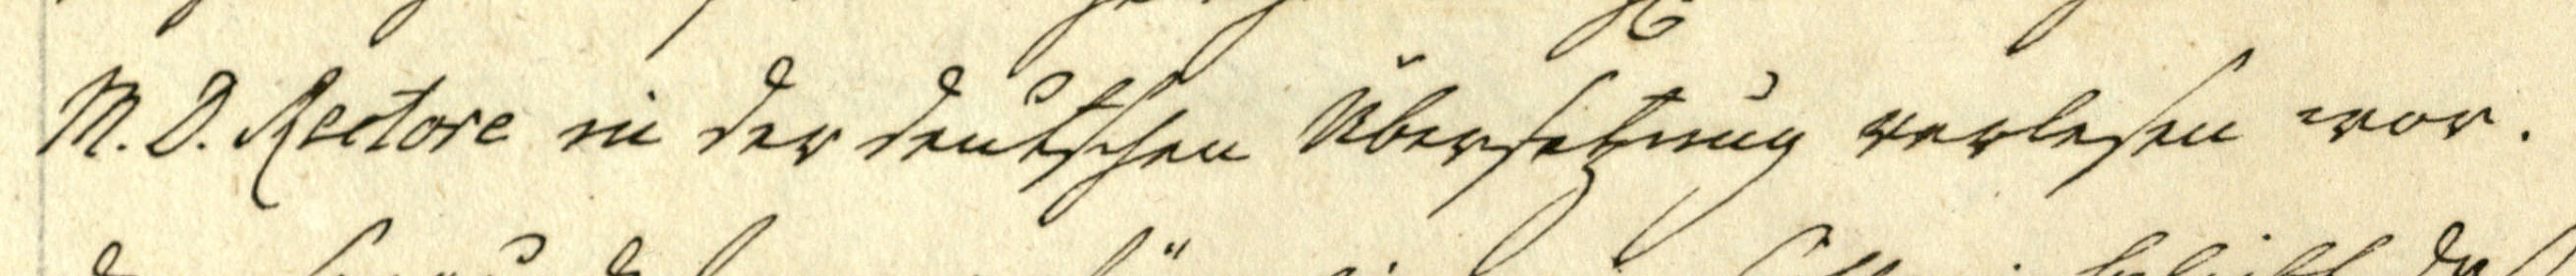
M. D. Rectore in der deutschen Übersetzung verlesen wor¬
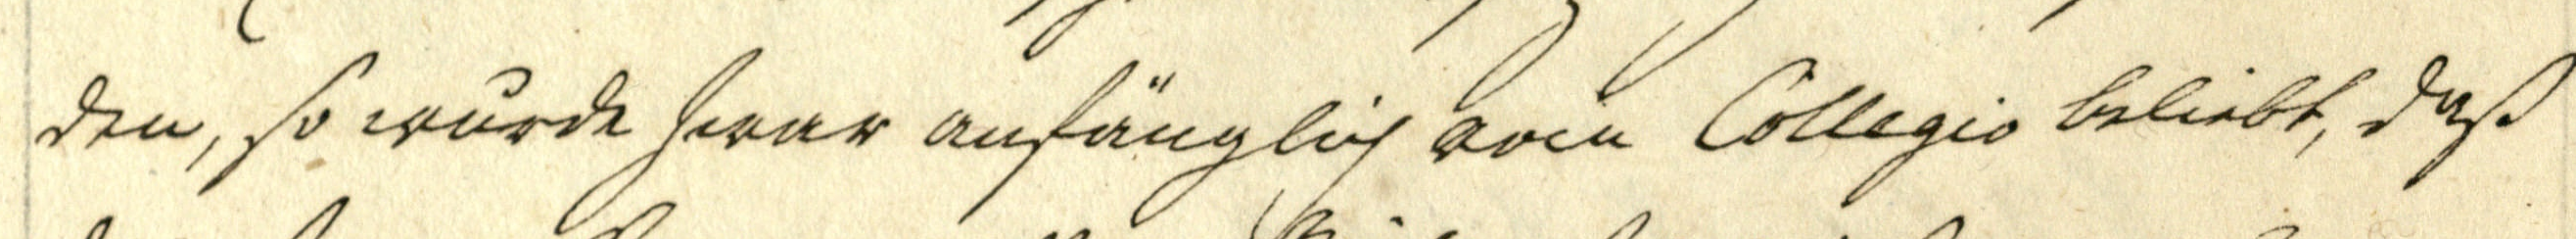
den, so wurde zwar anfänglich vom Collegio beliebt, daß
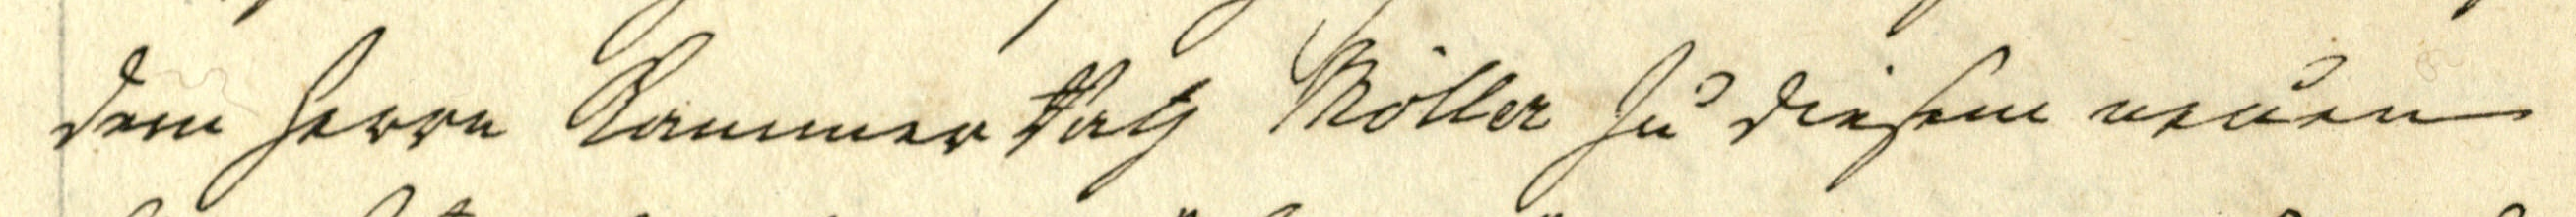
dem herrn Kammer Rath Möller zu diesem neuen
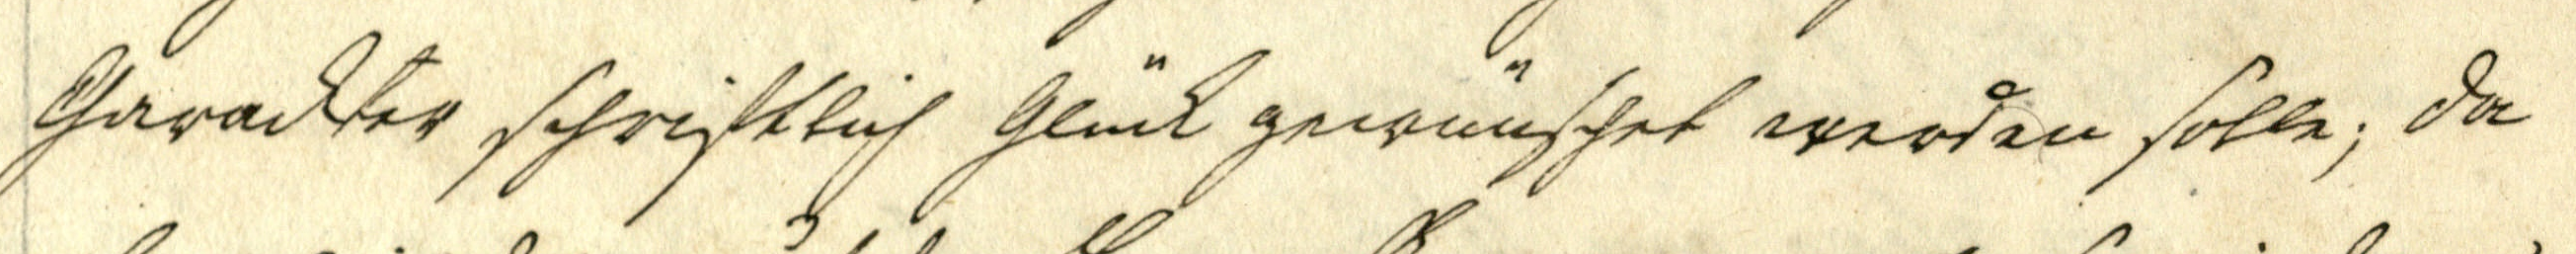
Charackter schriftlich Glück gewünschet werden solle, da
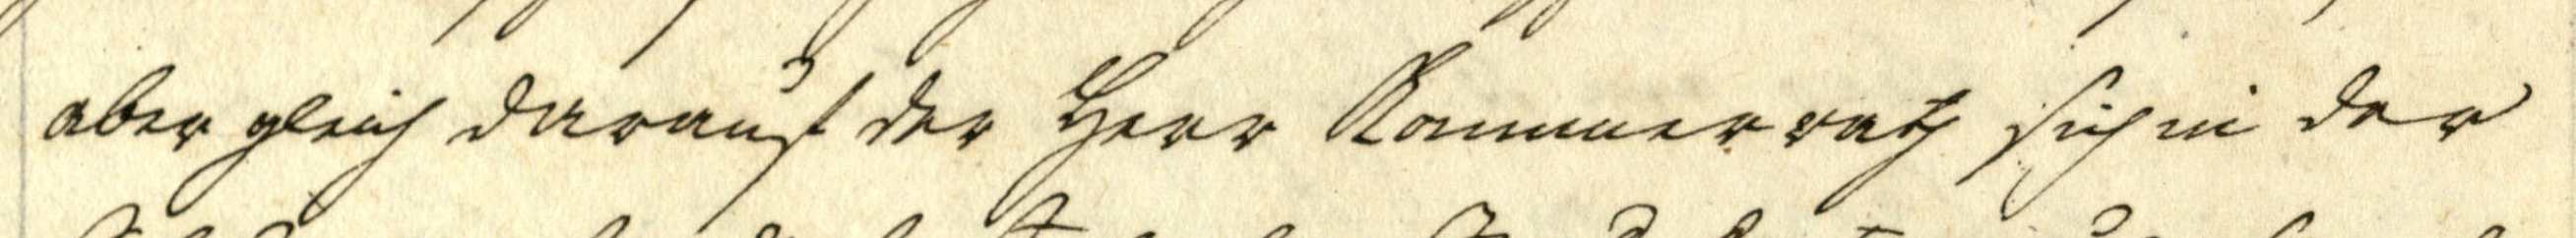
aber gleich darauf der Herr Kammerrath sich in der
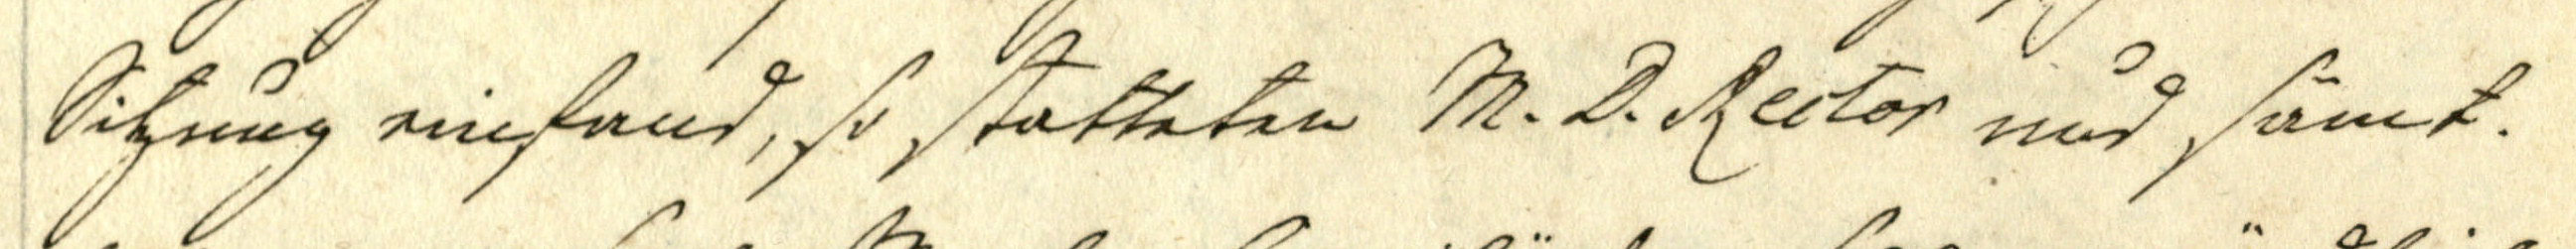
Sitzung einfand, so statteten M. D. Rector und sämt¬
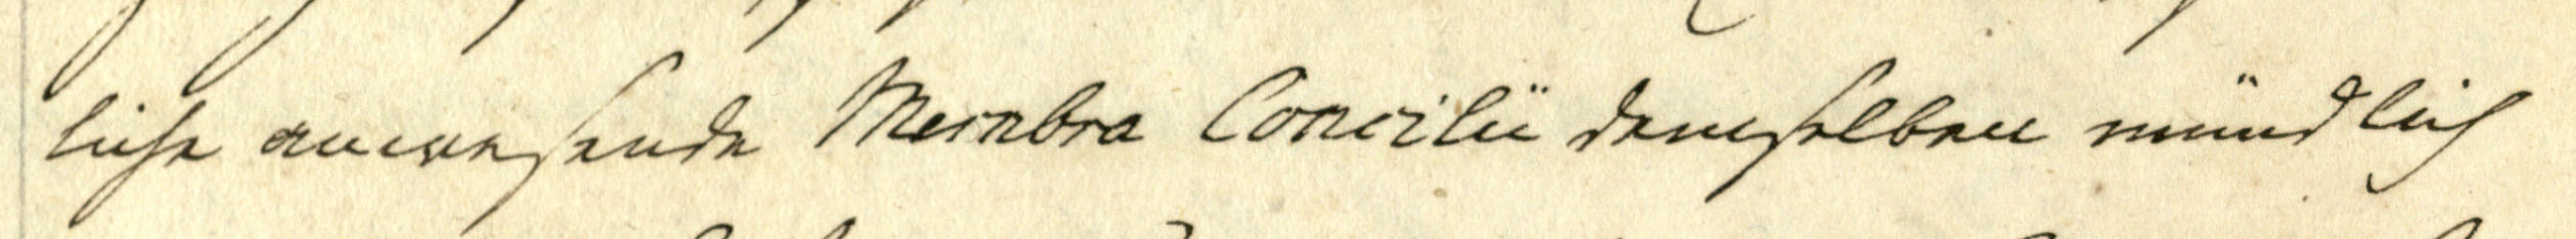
liche anwesende Membra Concilii demselben mündlich
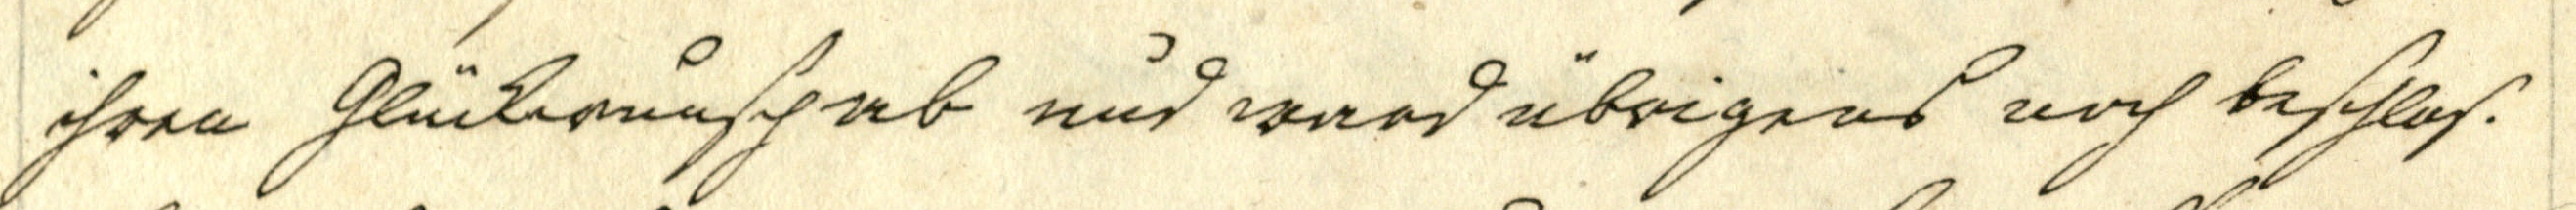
ihren Glückwunsch ab und ward überigens noch beschlos¬
